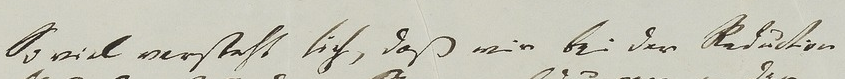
So viel versteht sich, daß wir bei der Reduction
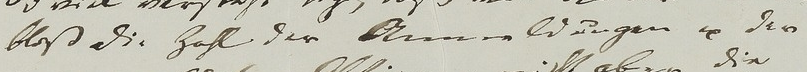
bloß die Zahl der Anmeldungen & der
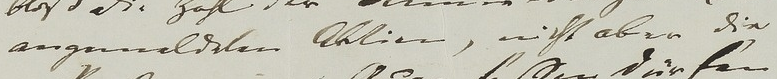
angemeldeten Aktien, nicht aber die
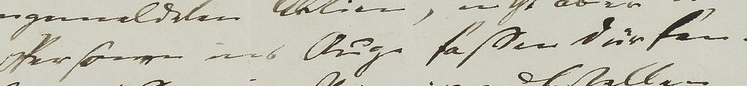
Personen ins Auge fassen dürfen.
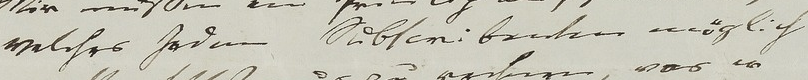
welches Jedem Subscribenten möglich
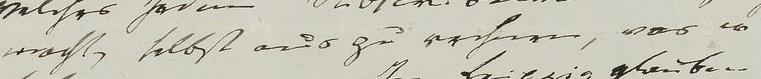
macht, selbst aus zu rechnen, was er
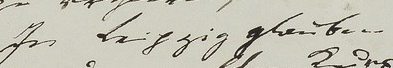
In Leipzig glauben
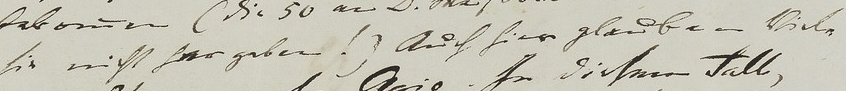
sie nicht her geben!) Auch hier glauben Viele
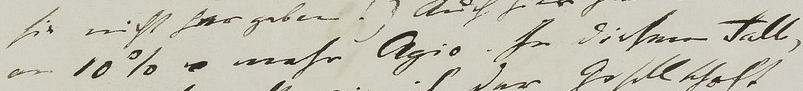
an 10% & mehr Agio. In diesem Fall,
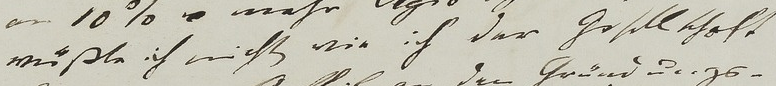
wüßte ich nicht, wie ich der Gesellschaft
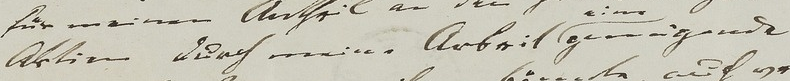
Aktien durch meine Arbeit eine genügende
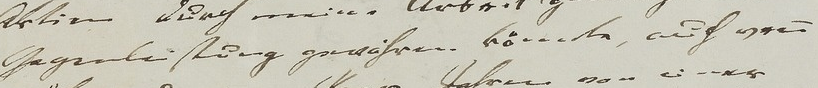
Gegenleistung gewähren könnte, auch wenn
